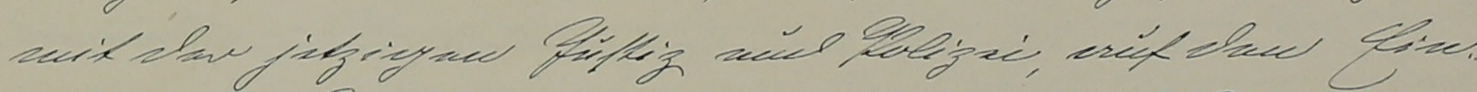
mit der jetzigen Justiz und Polizei, auf den Ein-
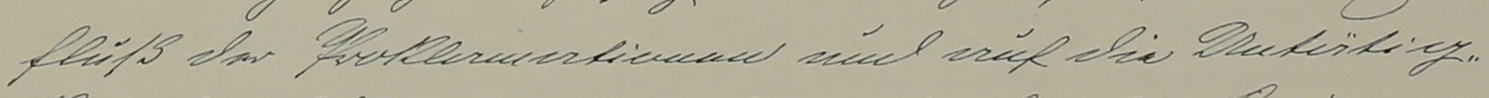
fluß der Proklamationen und auf die Untätig-
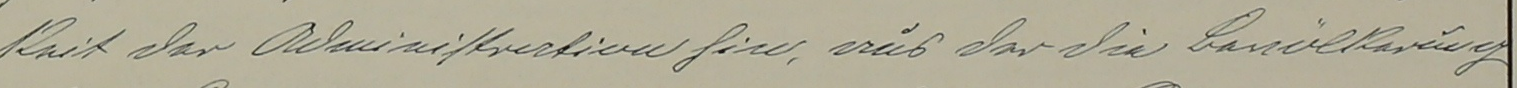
keit der Administration hin, aus der die Bevölkerung
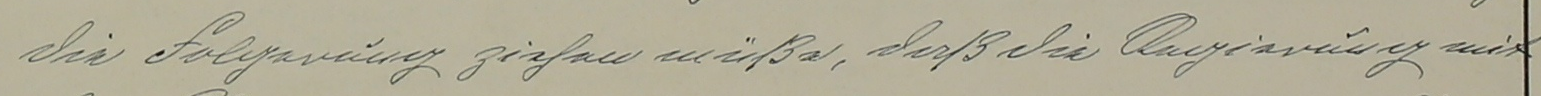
die Folgerung ziehen müße, daß die Regierung mit
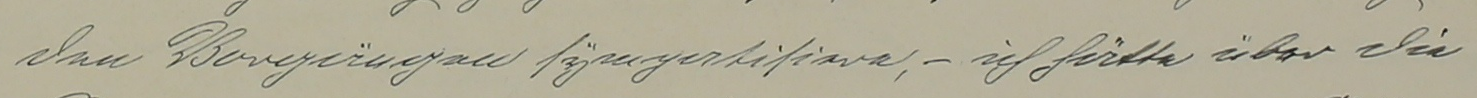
den Vorgängen sympatisiere, – ich hätte über die
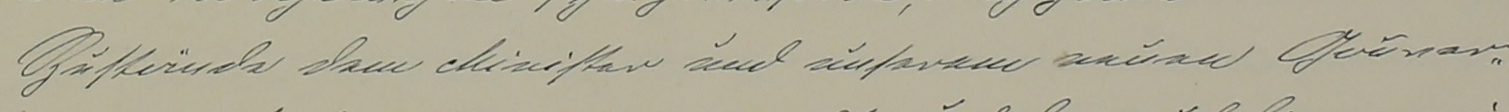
Zustände dem Minister und unserem neuen Gouver-
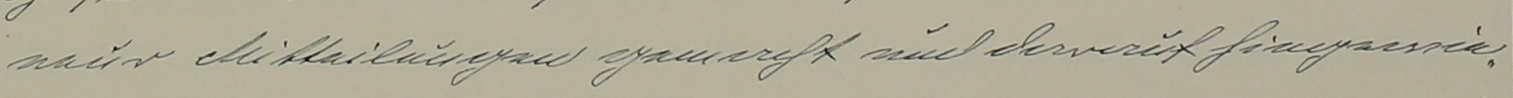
neur Mitteilungen gemacht und darauf hingewie-
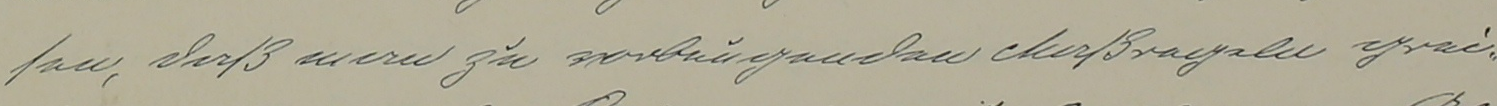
sen, daß man zu vorbeugenden Maßregeln grei-
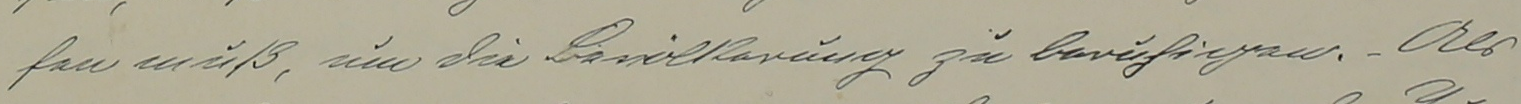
fen muß, um die Bevölkerung zu beruhigen. - Als
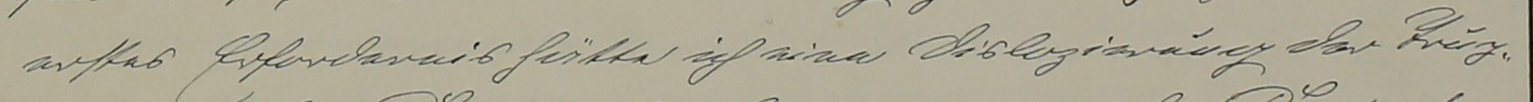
erstes Erfordernis hätte ich eine Dislozierung der Trup-
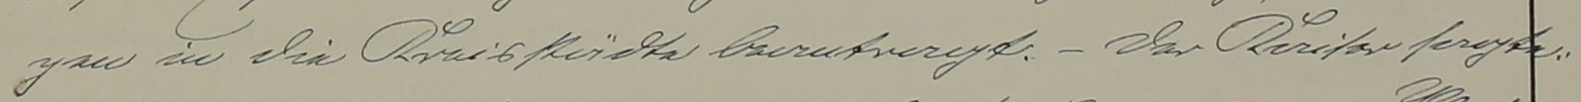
pen in die Kreisstädte beantragt. – Der Kaiser sagte:
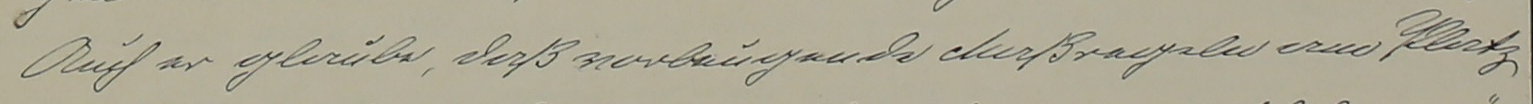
Auch er glaube, daß vorbeugende Maßregeln am Platz
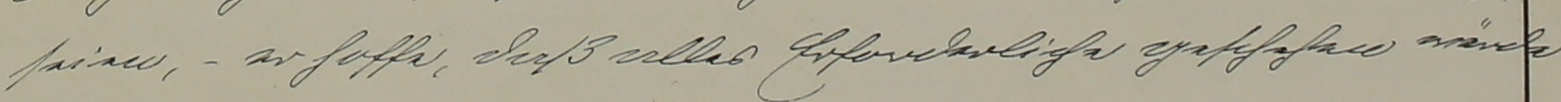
seien, - er hoffe, daß alles Erforderliche geschehen würde
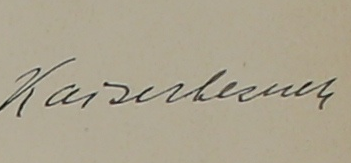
Kaiserbesuch
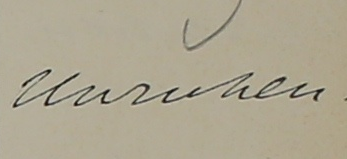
Unruhen
